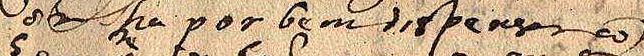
sor ha por bem dispensar cō
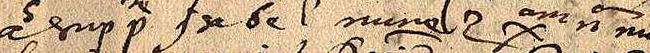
a suppte jsabel nunez xam na mo
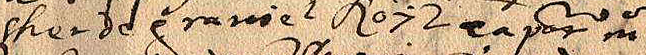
lher de grauiel Royz̄ çapatro mor
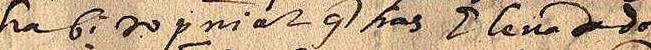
habito pn̄iaL q̄ tras E leuātada
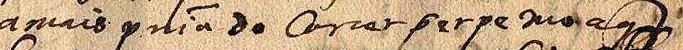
a mais pnīa do Carcer perpetuo a q̄
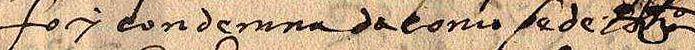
foy condemnada como pede E Vta
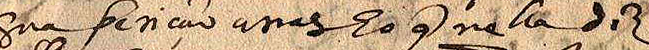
sua petição atras E o q̄ nella diz
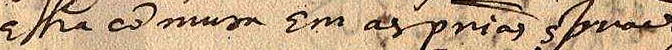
E lha cōmuta Em as pnīas s̄pruaes
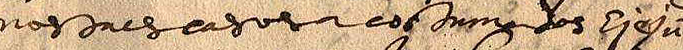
nos taes casos acostumados E jejū
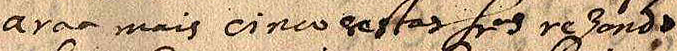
araa mais cinco sestas fras rezando
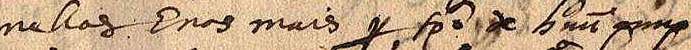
nellas E nas mais ꝑ tpō de huū anno
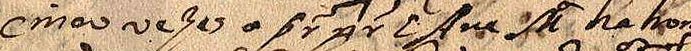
cinco vezes o pr̄ nr̄ E Aue Ma ha hon
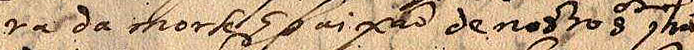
ra da morte E paixaõ de nostro sor jhū
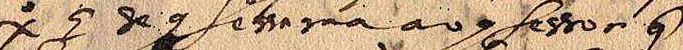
Xo E se ꝯfessaraa ao ꝯfessor q̄
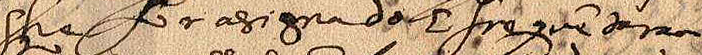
lhe for asignado E frequētaraa
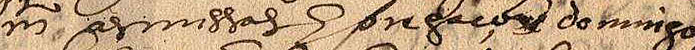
mto as missas E pregações domingꝯ
